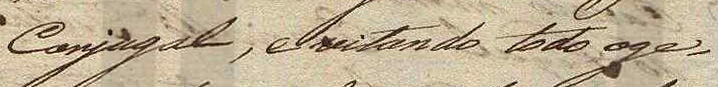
Conjugal, evitando todo o ge
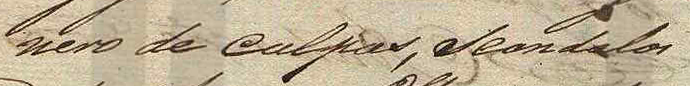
nero de culpas, scandalos
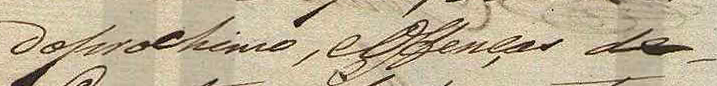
do prochimo, e Offenças de
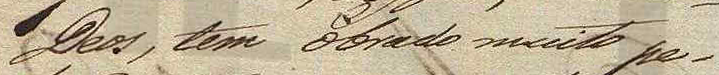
Deos, tem obrado muito pe
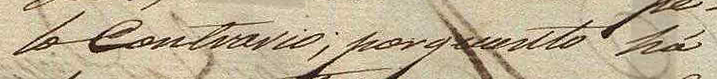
lo Contrario; porquanto há
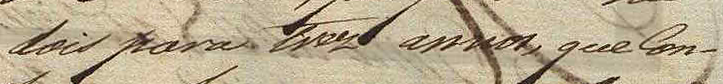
dois para trez annos, que Con
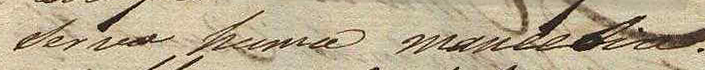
serva huma mancebia.
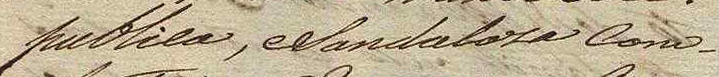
publica, e Sandaloza com
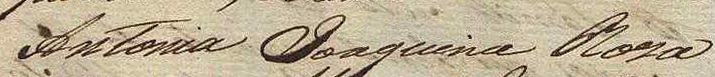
Antonia Ioaquina Roza
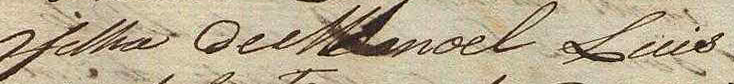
filha de Manoel Luis
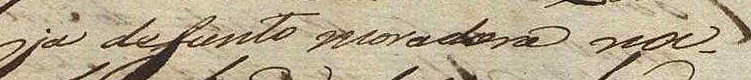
ja defunto moradora na
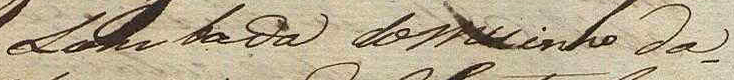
Lombada do muinho da
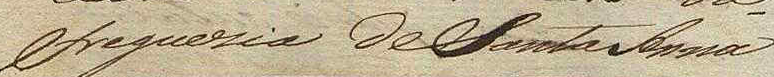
freguezia de Santa Anna
